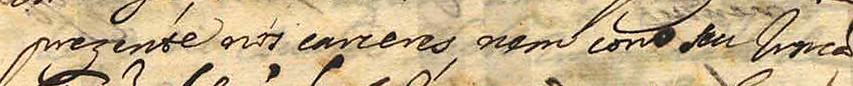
prezente nos carceres, nem com seu Irmaõ
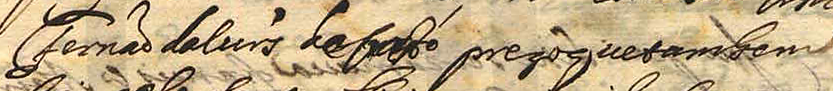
Fernaõ dalur̄s de Crasto prezo que tambem
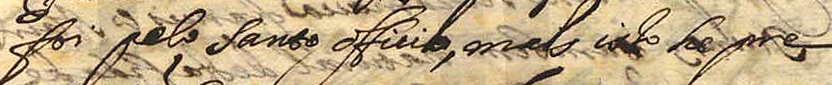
foi pelo Santo officio, mais isto he pre
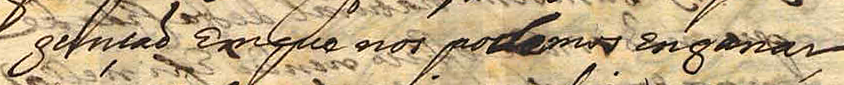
zunçaõ Em que nos podemos Enganar
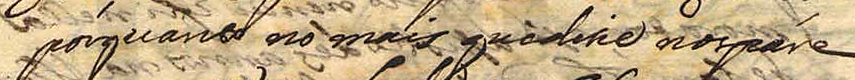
porquanto no mais que disse nos pare
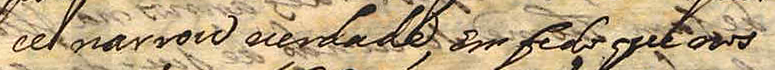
ce narrou uerdade, em fe do que nos
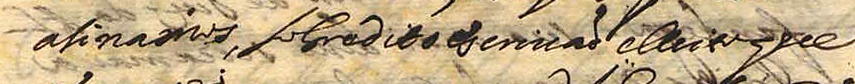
asinamos, sobredito escriuaõ elleito que
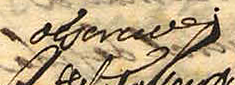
o escreuj
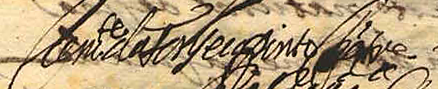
Clemte da Fonseca pinto Chātre
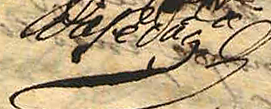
da sé da gda
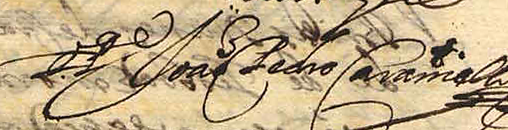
O P.e Joaõ Pedro Caramello
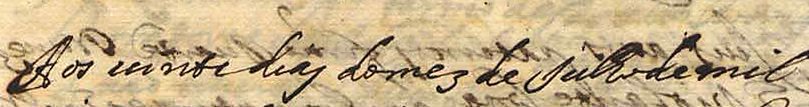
Aos uinte dias do mez de Iulho de mil
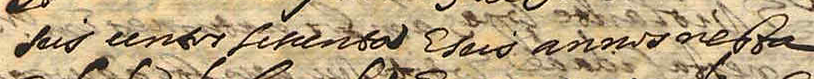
seiscentos sessenta E seis annos nesta
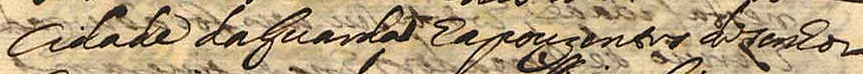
Cidade da Guarda E apozentos do senhor
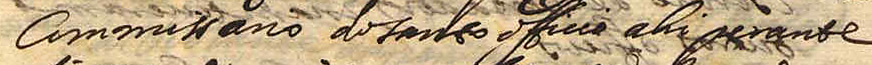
Commissario do santo officio ahi perante
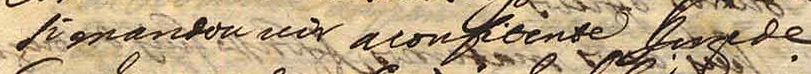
si mandou uir a confitente Jorge de
